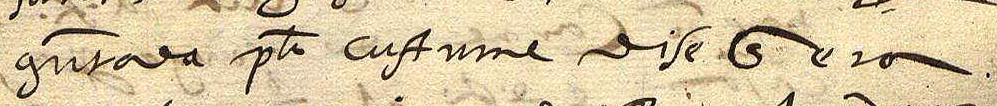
gūtada p̄lo custume dise q̄ era
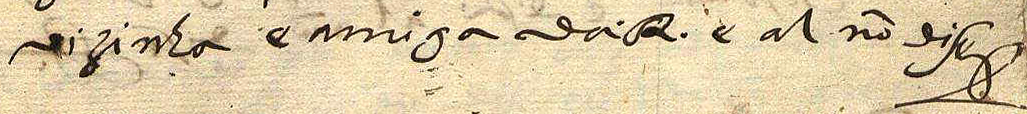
vizinha e amiga da .R. e al nō dise
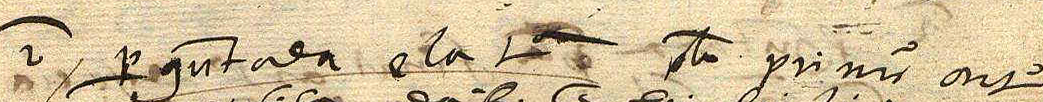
item ꝑgūtada ela ta p̄lo primro arto
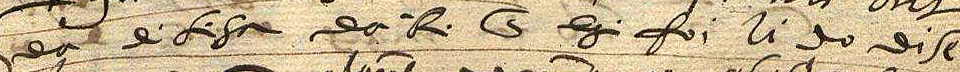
da defesa da R. q̄ lhe foi lido dise
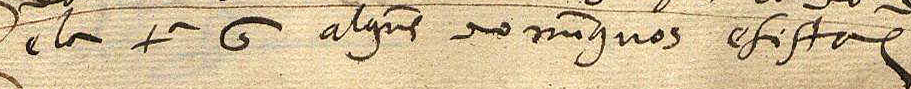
ela ta q̄ algūs domīguos e festas
